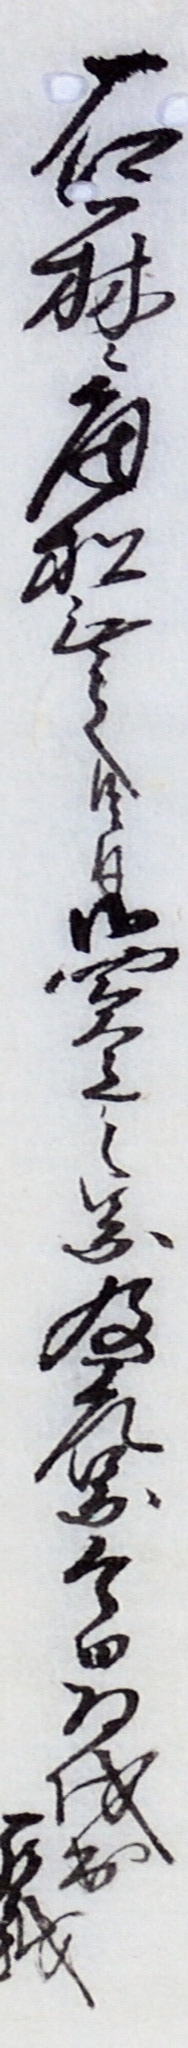右御林ニ唐松無之候ニ付御買上之図差出図今日為伐出罷越
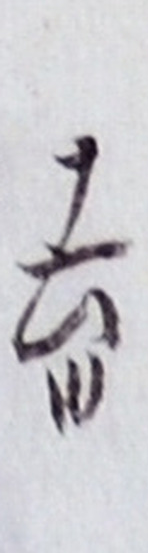十六日
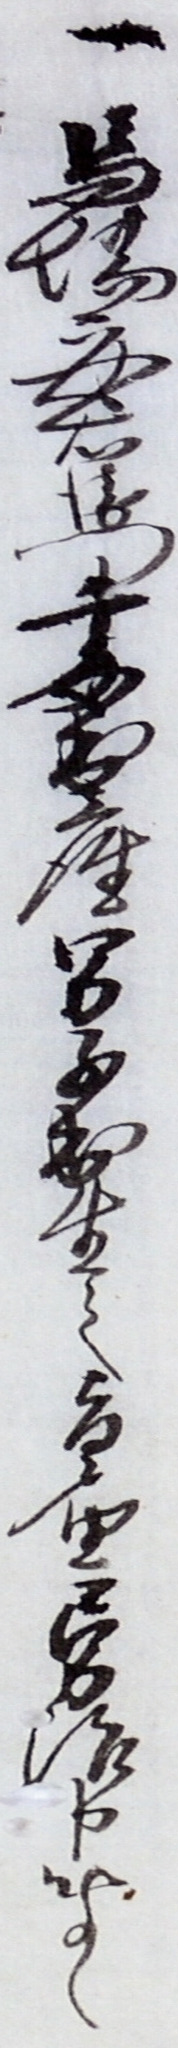一馬場安右衛門妻出産男子出生之旨届勇治申聞候
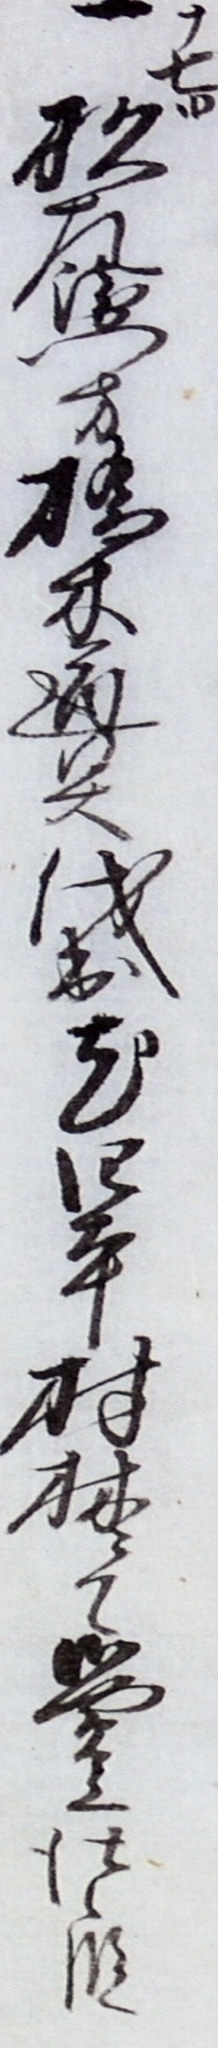一杉左衛門方橋木道具伐出尤四本村林ニて御買上仕候段
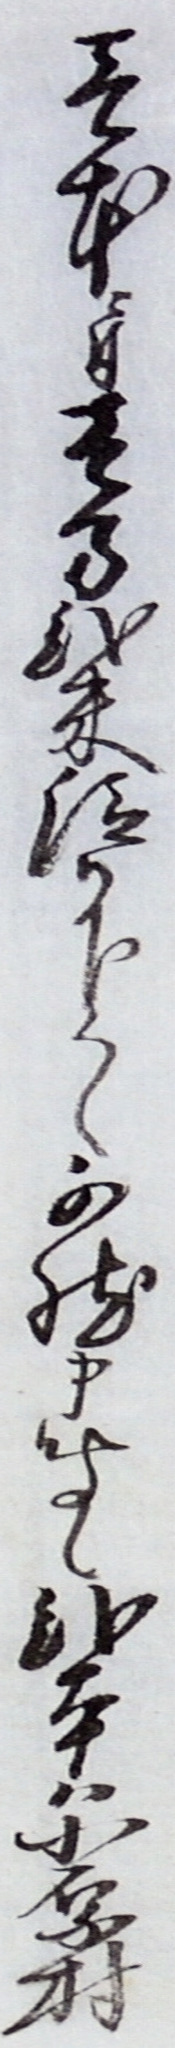壱本ニ付壱万分弐朱請被下候ハヽ可然申聞候弐本ハ小原村
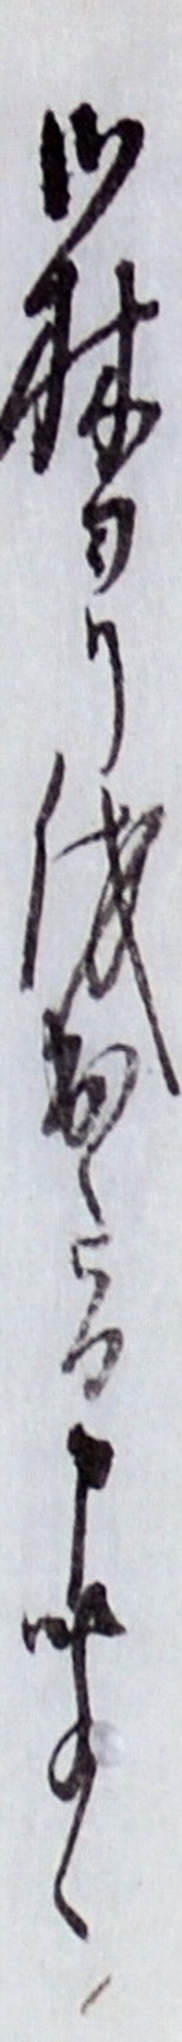御林ヨリ伐出候旨申聞候
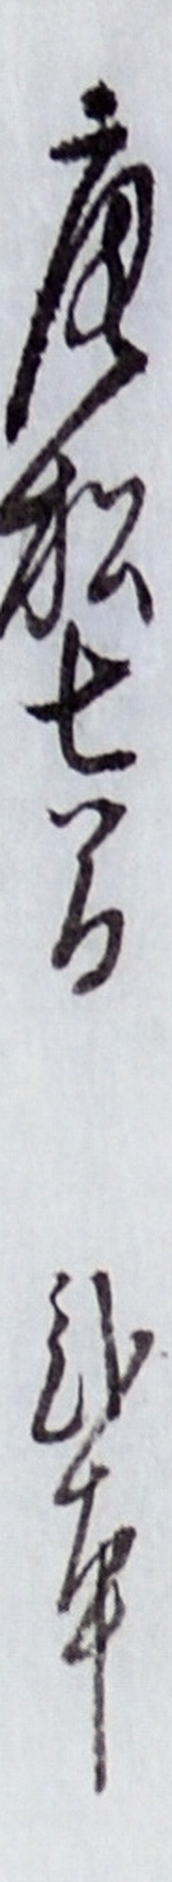唐松七間弐本
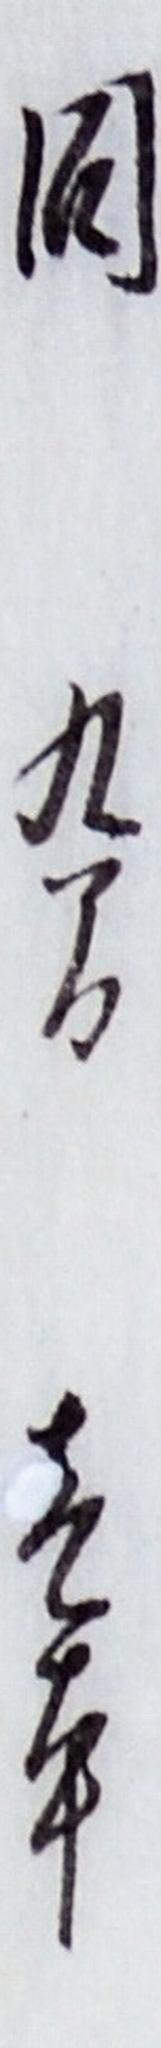同九間壱本

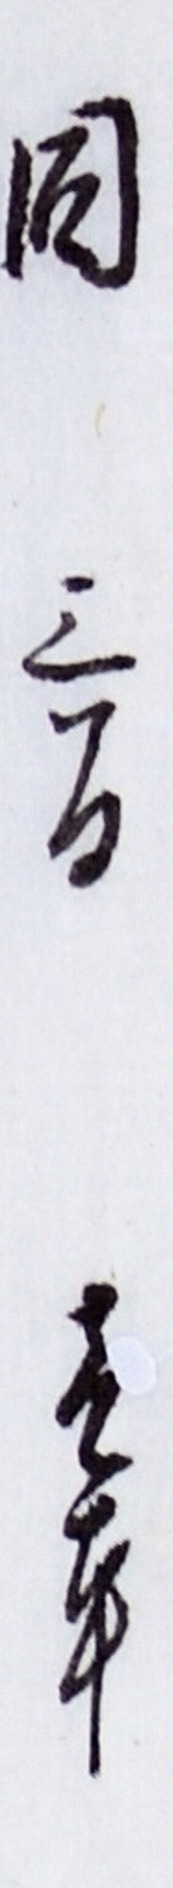同三間壱本
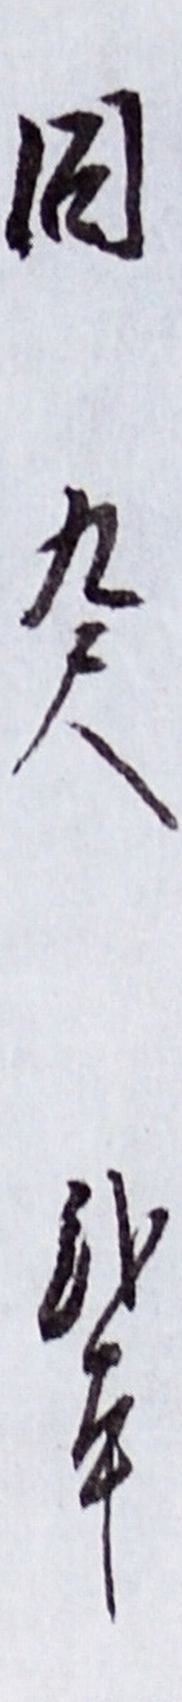同九尺弐本
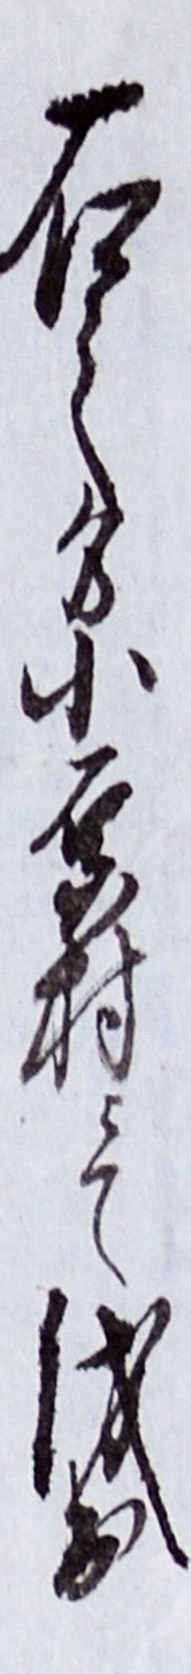右之分小原村ニて伐出
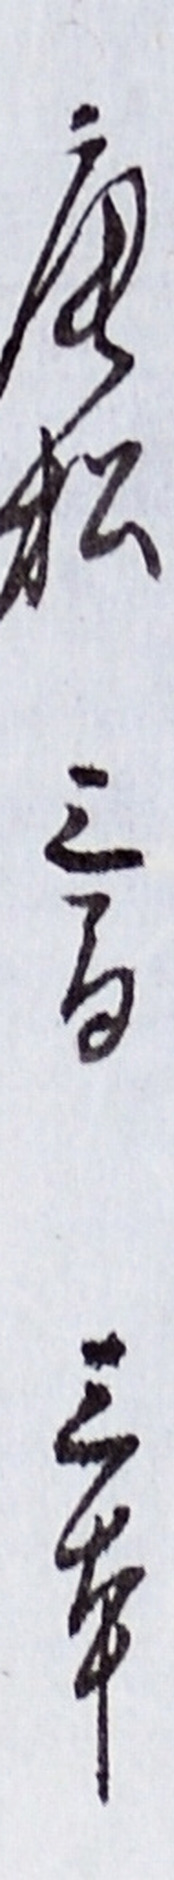唐松三間三本
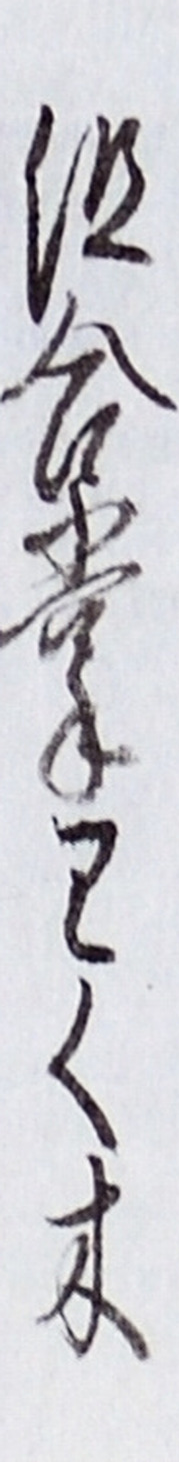但合掌わく木
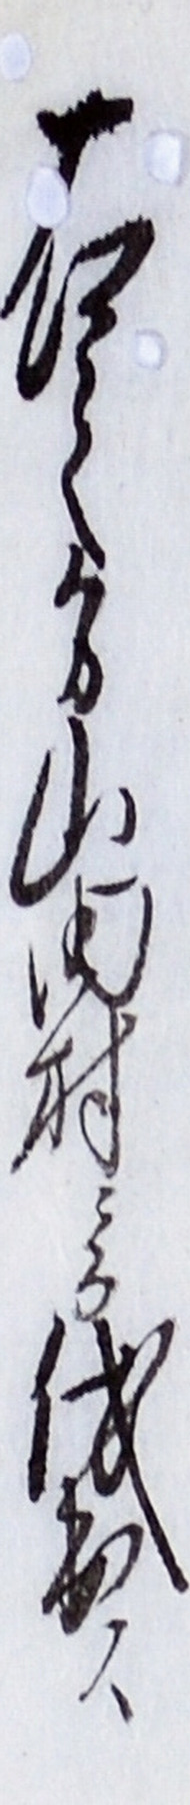右之分山田村ニ而伐出ス
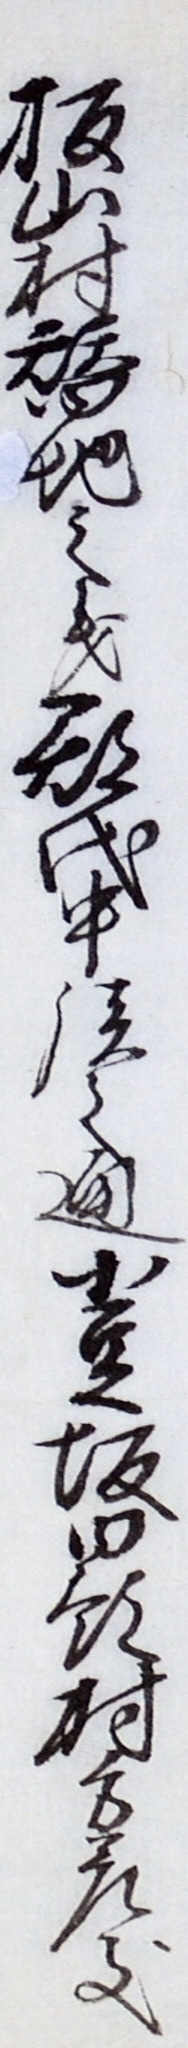一板山村替地之義郡代申談之通小豆坂日影村方差支
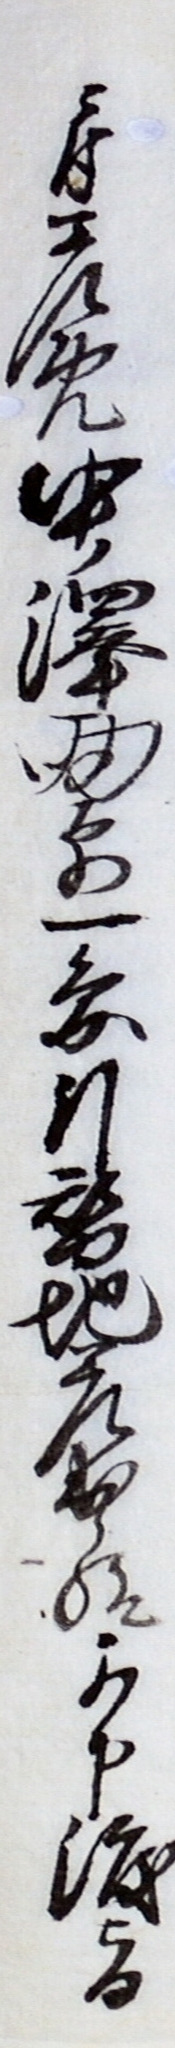ニ付差免中ノ澤西原一円引替地差出候様可申渡旨
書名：御山奉行御用控
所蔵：伊那市立高遠町図書館・合同会社AMANE
